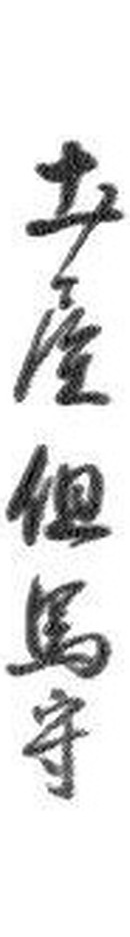土屋但馬守
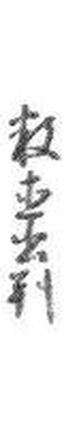数直書判
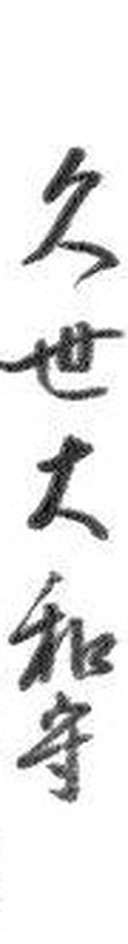久世大和守
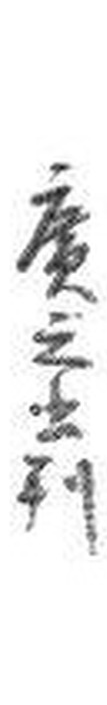広之書判

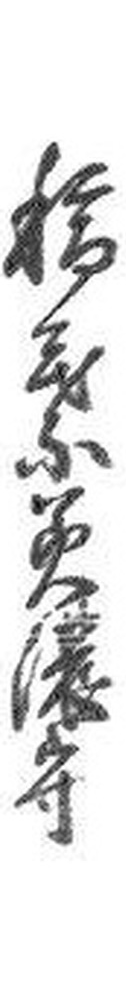稲葉美濃守
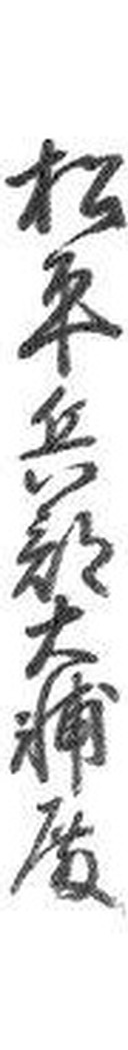松平兵部大輔殿
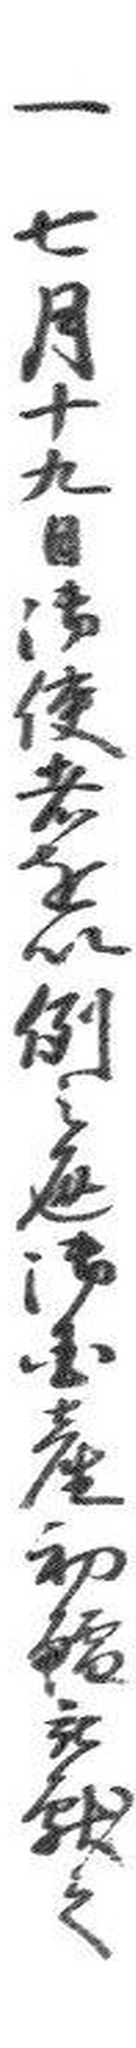一七月十九日御使者を以例之通御国産初鯖被献之
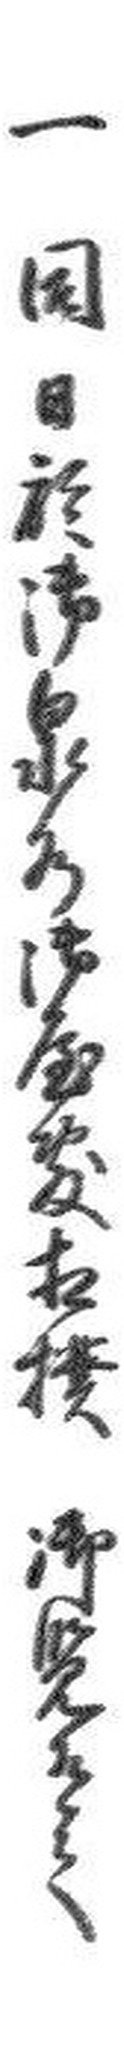一同日於御泉水御屋敷相撲御覧有之
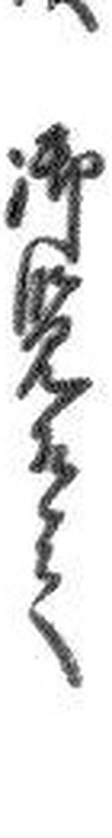御覧有之
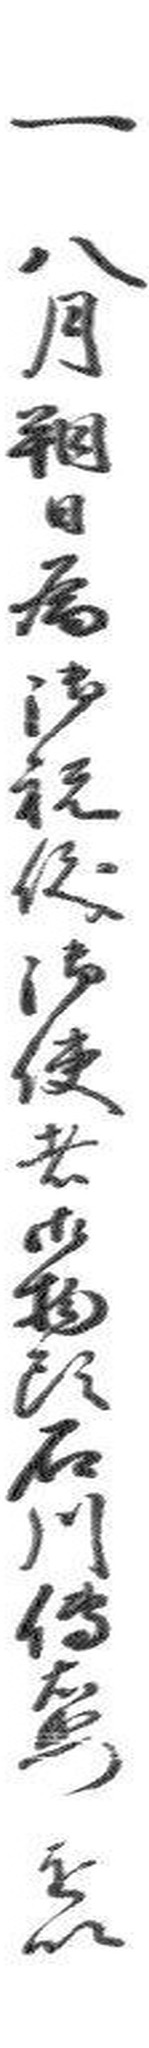一八月朔日為御祝儀御使者御物頭石川伝右衛門を以
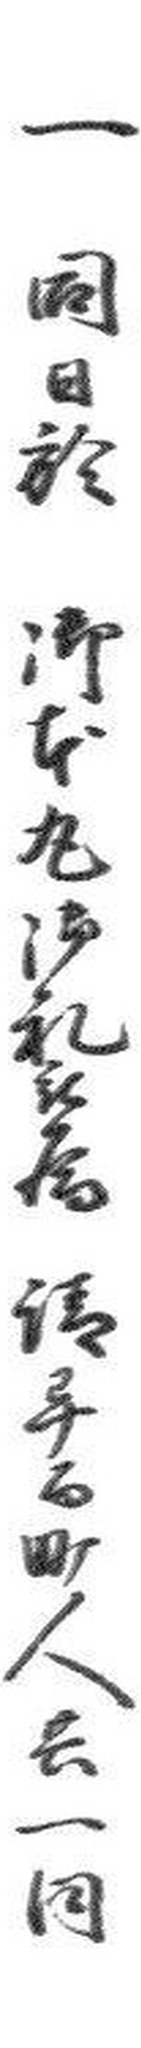一同日於御本丸御礼被為請畢而町人共一同
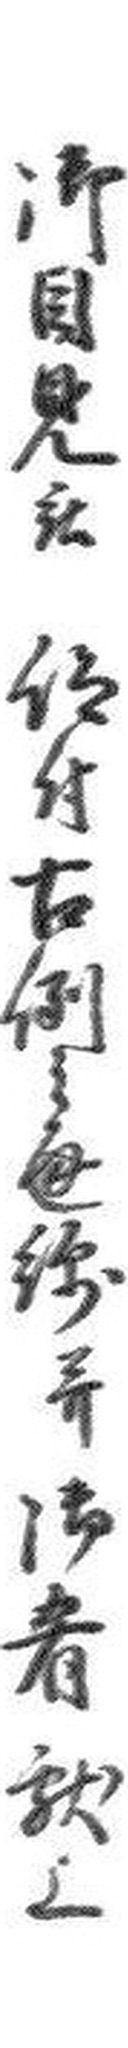御目見被仰付右例之通綿幷御肴献上
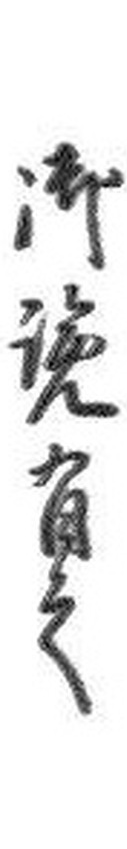御覧有之
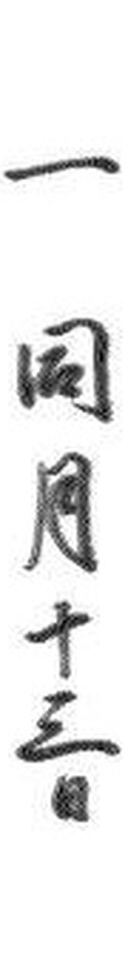一同月十三日
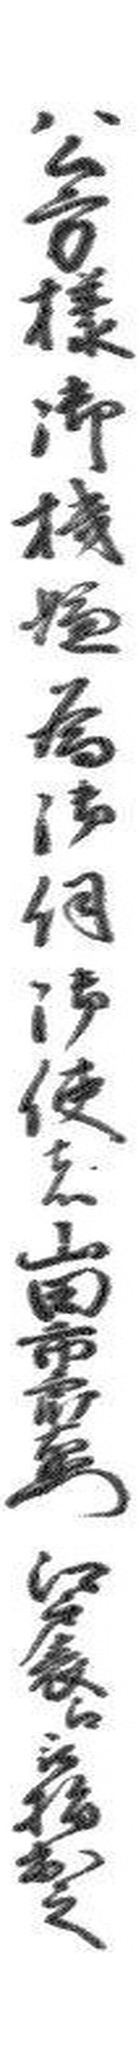公方様御機嫌為御伺御使者山田市郎右衛門江戸表江被指出之

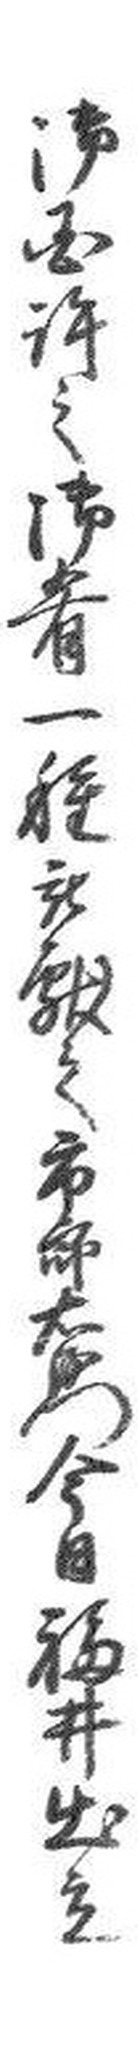御国許之御肴一種被献之市郎右衛門今日福井出立
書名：家譜 十一 昌親公 従延宝二年到延宝四年八月
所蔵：福井県文書館 Fukui Prefectural Archives
